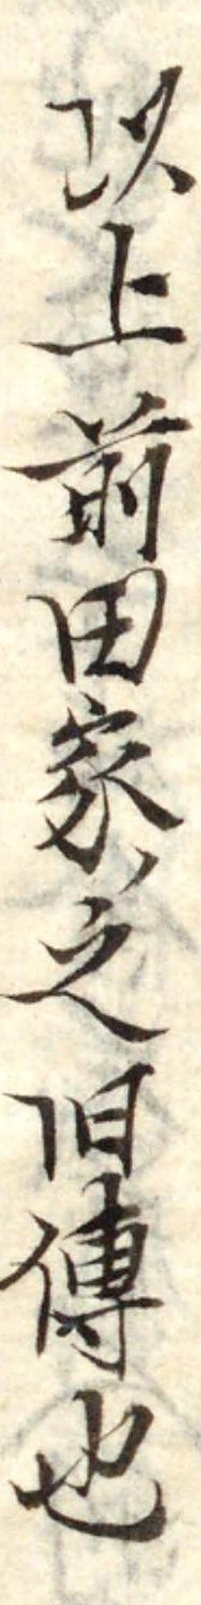以上前田家之旧伝也
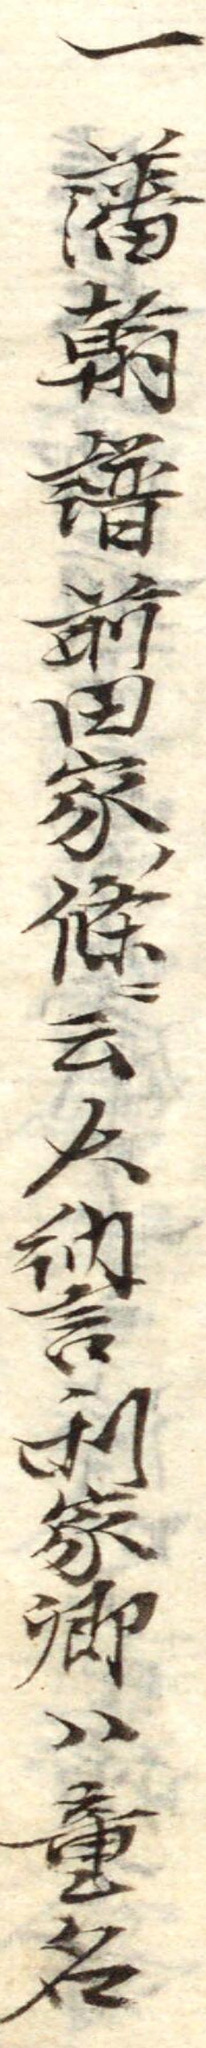一藩翰譜前田家の條に云う大納言利家卿は童名
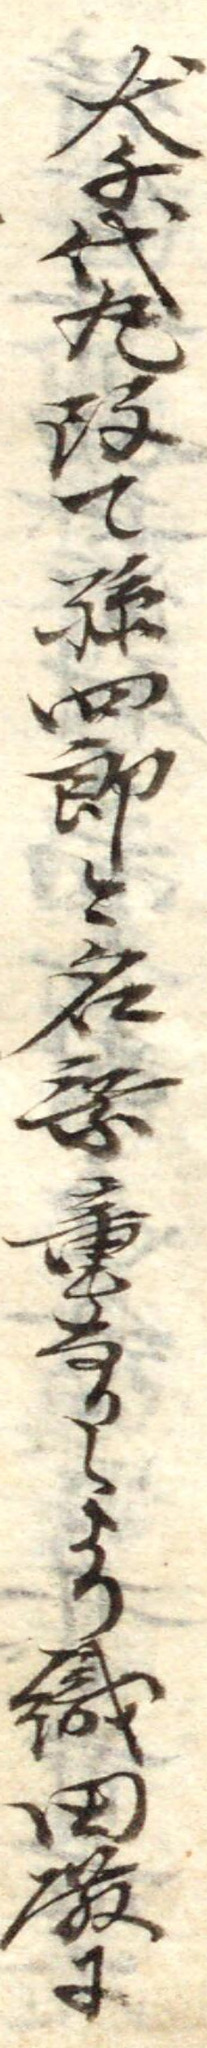犬千代丸改て孫四郎と名乗童なりしより織田殿尓
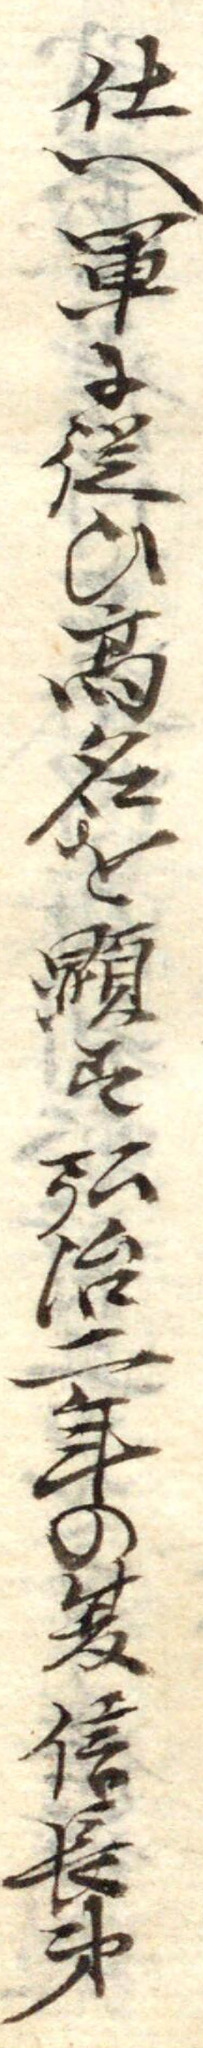仕へ軍尓従ひ高名を顕春弘治二年の夏信長弟

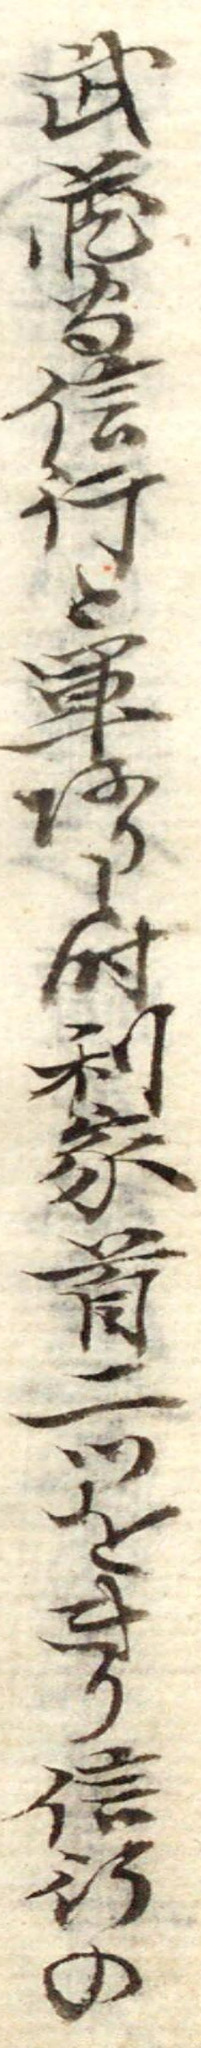武蔵守信行と軍阿りし時利家首二つをきり信行の
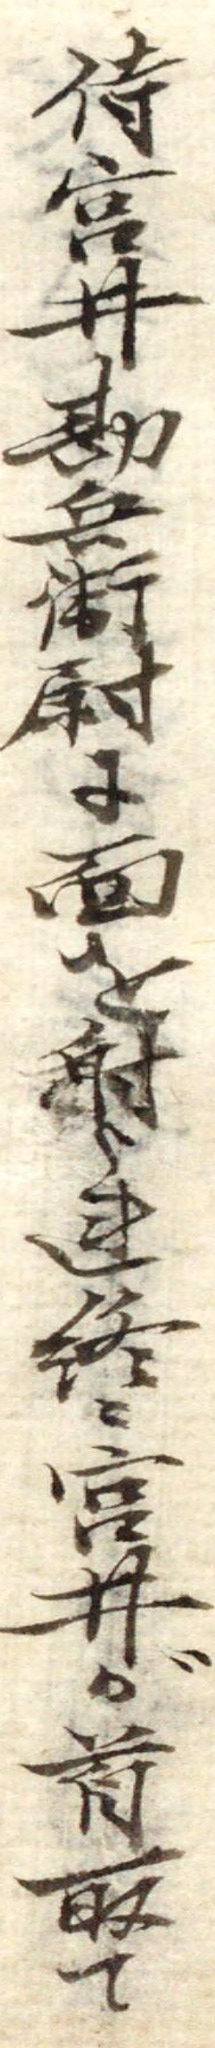侍宮井官兵衛尉尓面を射ら連終に宮井が首取て
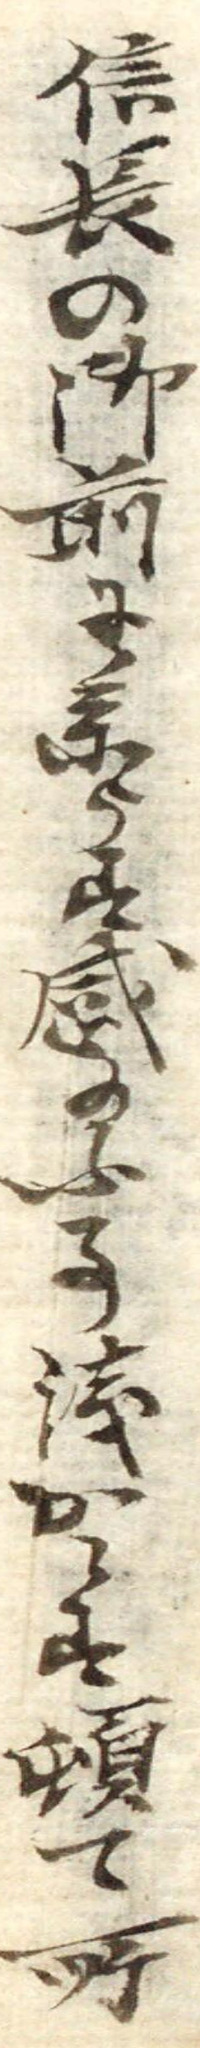信長の御前尓参ら春感ゐふ事浅から春頓て所
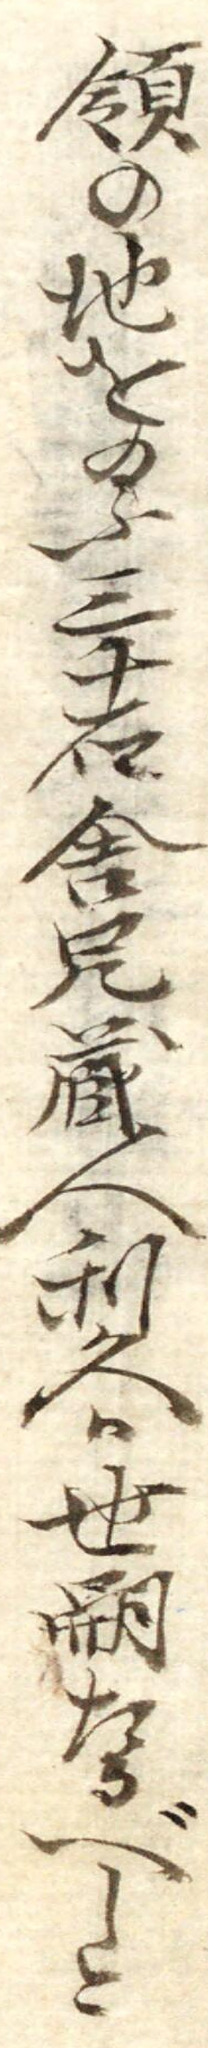領の地をゐふ三千石舎兄蔵人利久か世嗣たるべしと
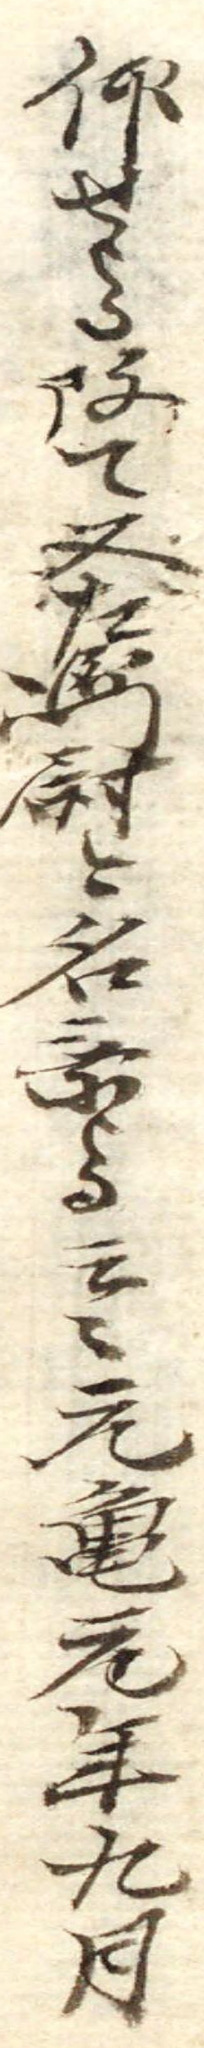仰せらる改て又左衛門尉と名乗る云々元亀元年九月
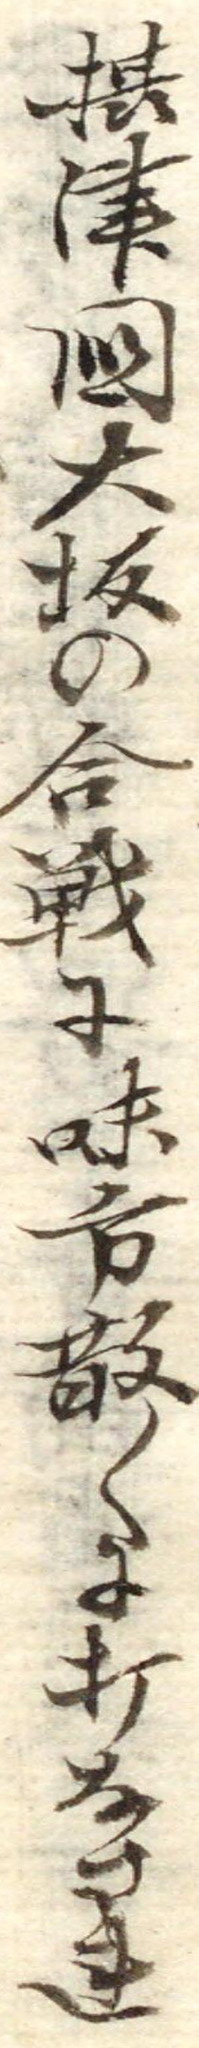摂津国大阪の合戦尓味方散々尓打なさ連
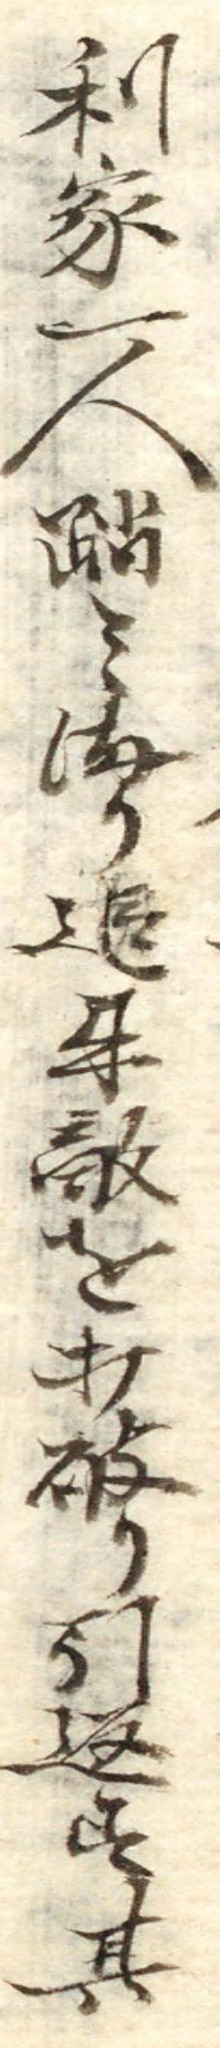利家一人踏み満り追来敵を打破り引返春其
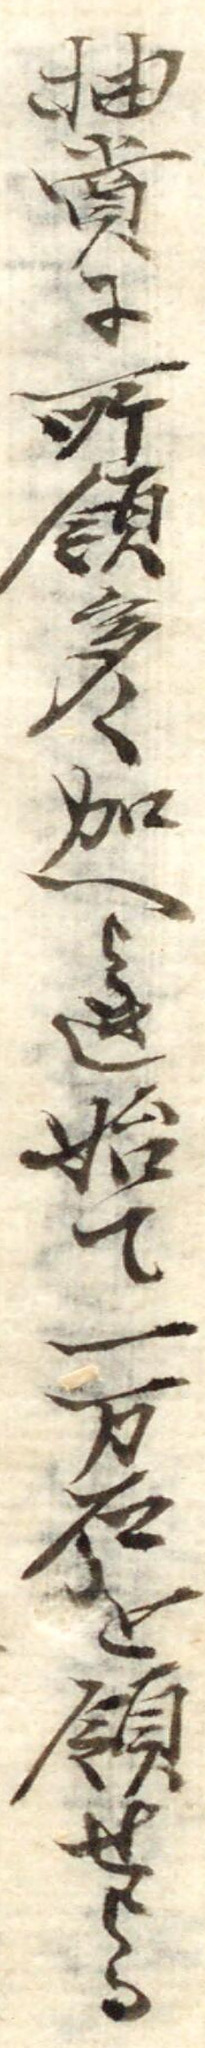抽賞尓所領多く加へら連始て一万石を領せらる
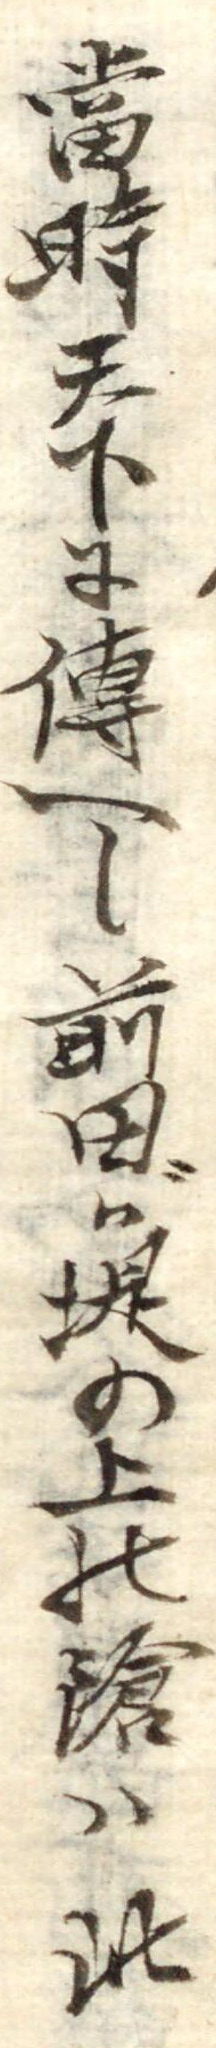当時天下尓伝へし前田が堤の上能鎗は此
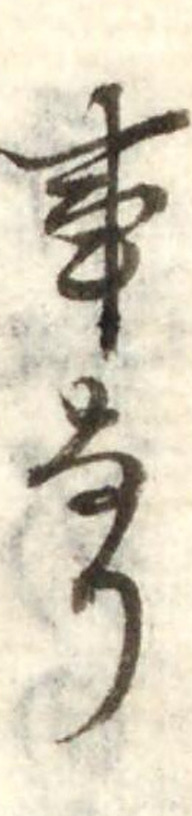事なり
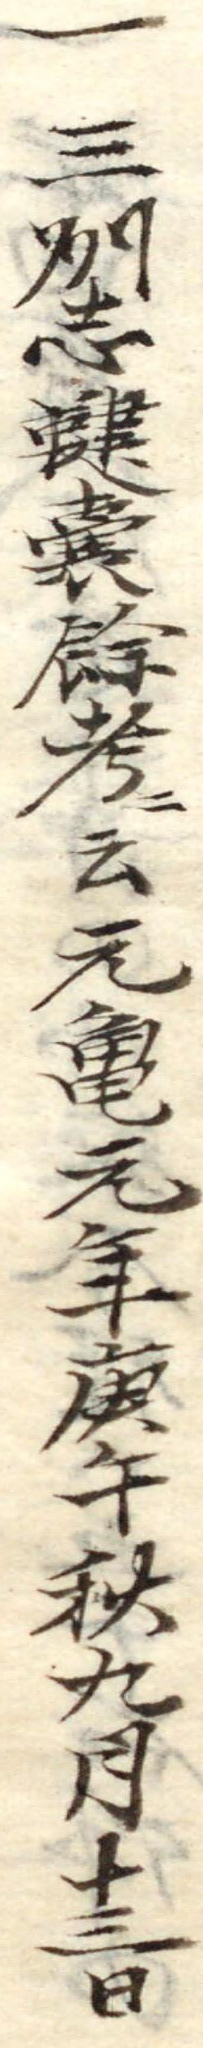一三州志鞬嚢余考に云元亀元年公庚午秋九月十三日
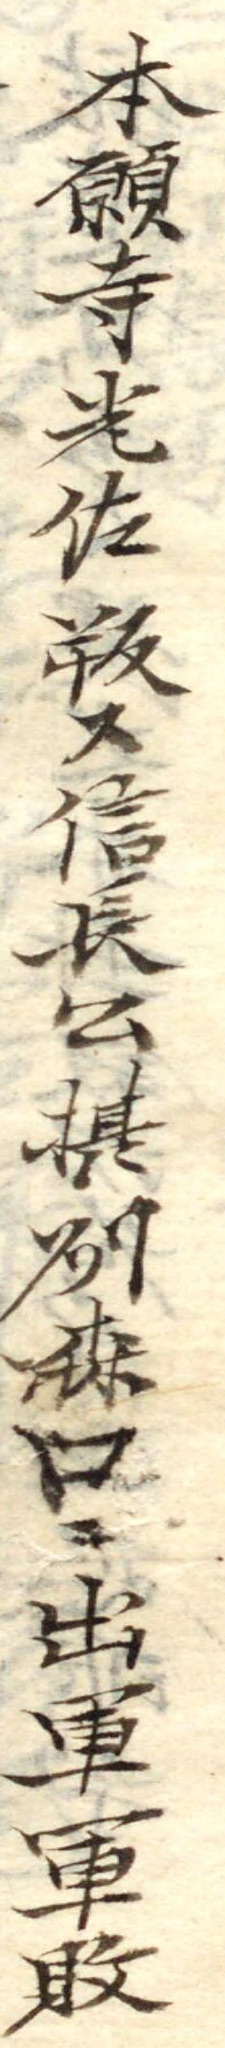本願寺光佑叛す信長公摂州森口に出軍軍敗
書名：前田家封国証書集録
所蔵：Ishikawa Prefectural Library
